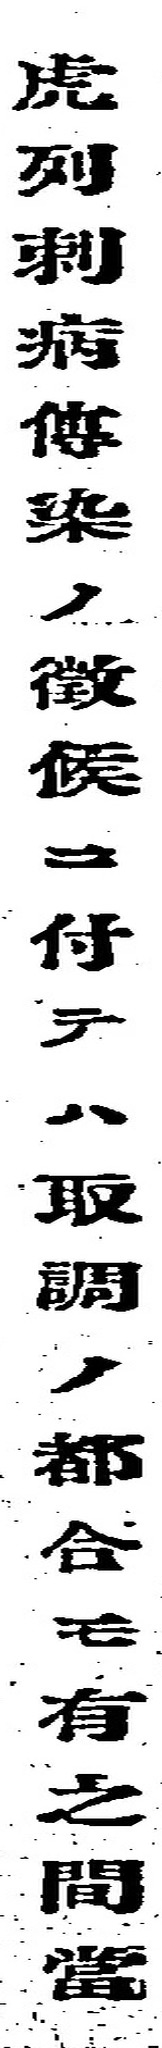虎列刺病伝染ノ徴候ニ付テハ取調ノ都合モ有之間当
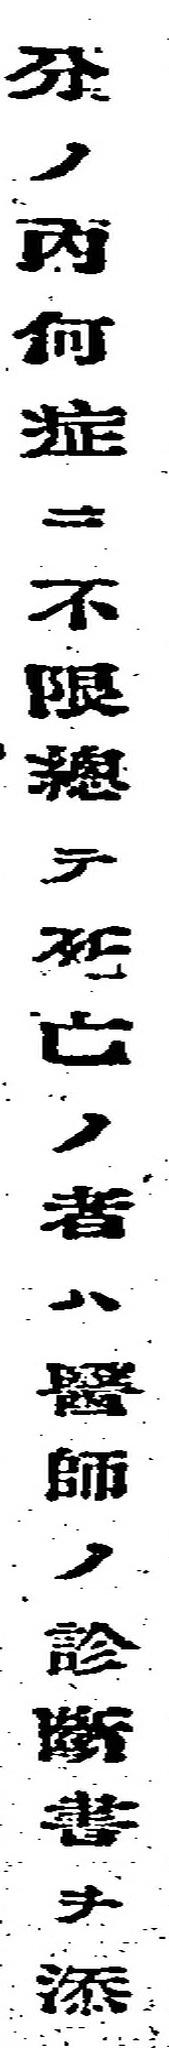分ノ内何症ニ不限総テ死亡ノ者ハ医師ノ診断書ヲ添
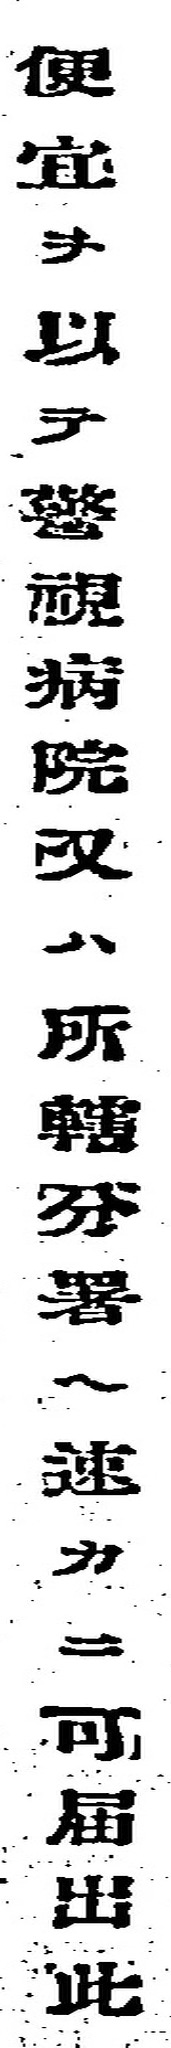便宜ヲ以テ警視病院又は所轄分署へ速カニ可届出此
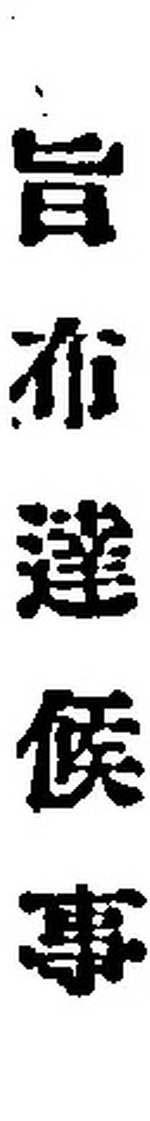旨布達候事
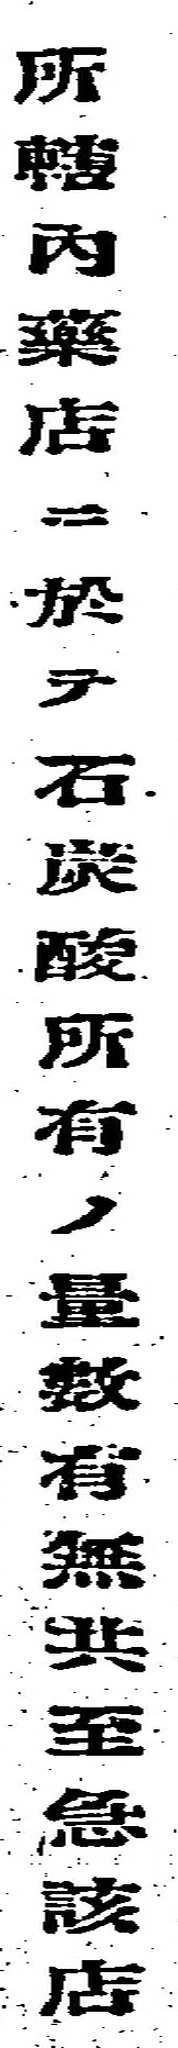所轄内薬店ニ於テ石炭酸所有ノ量数有無共至急該店
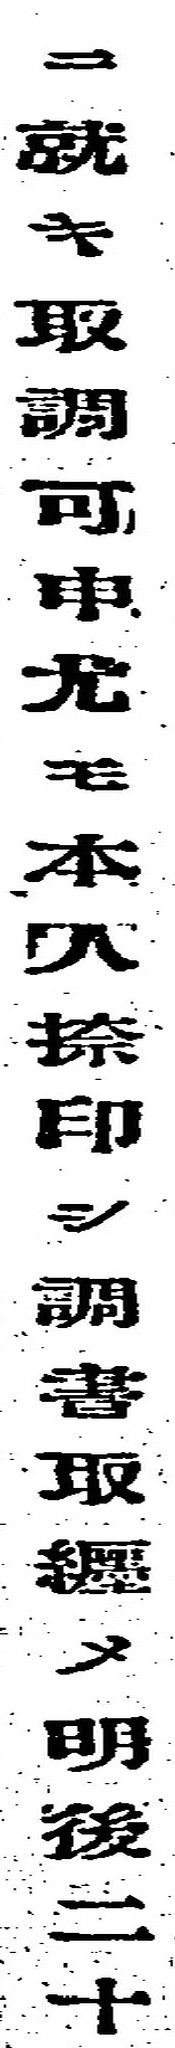ニ就キ取調可申尤モ本人捺印シ調書取纏メ明後二十
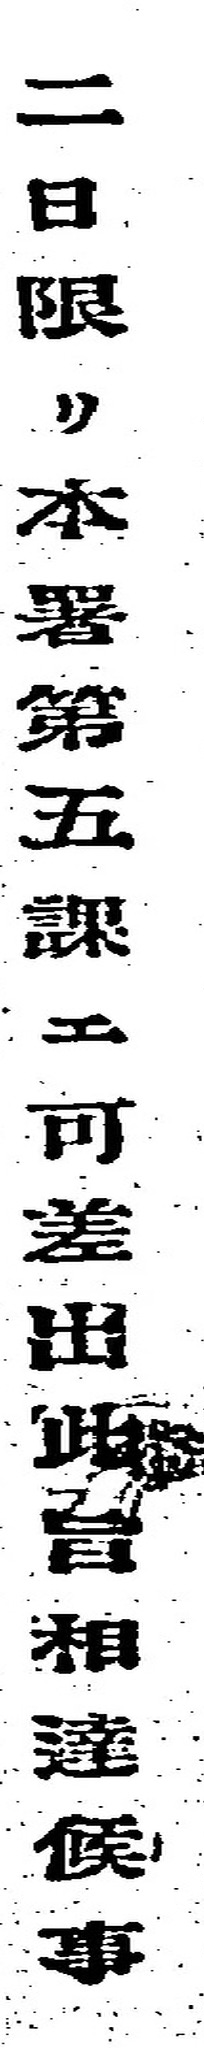二日限リ本署第五課エ可差出此旨相達候事

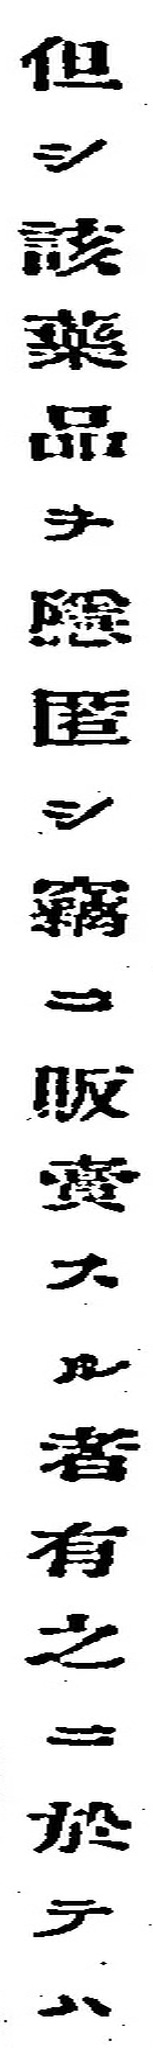但シ該薬品ヲ隠匿シ窃ニ販売スル者有之ニ於テハ
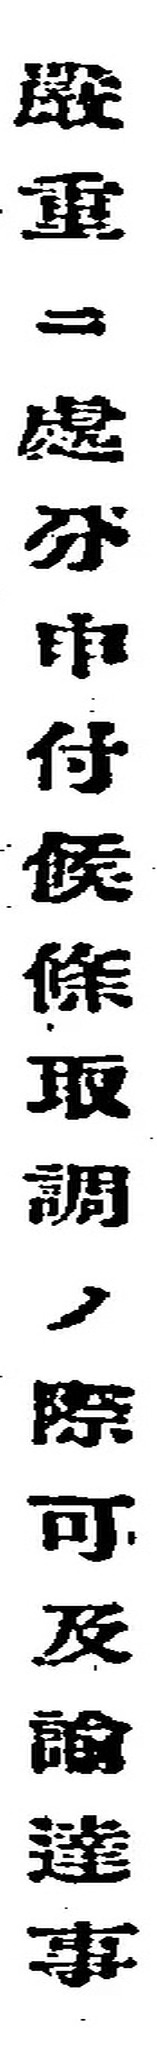厳重ニ処分申付候条取調ノ際可及諭達事
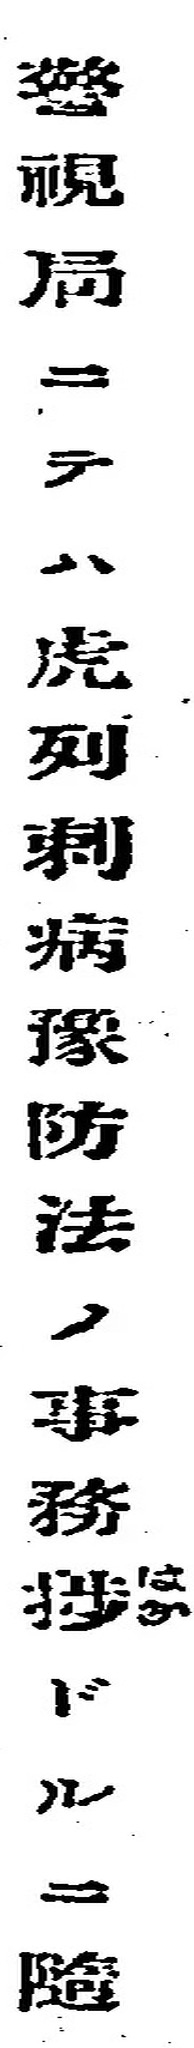警視局ニテハ虎列刺病予防法ノ事務捗ドルニ随
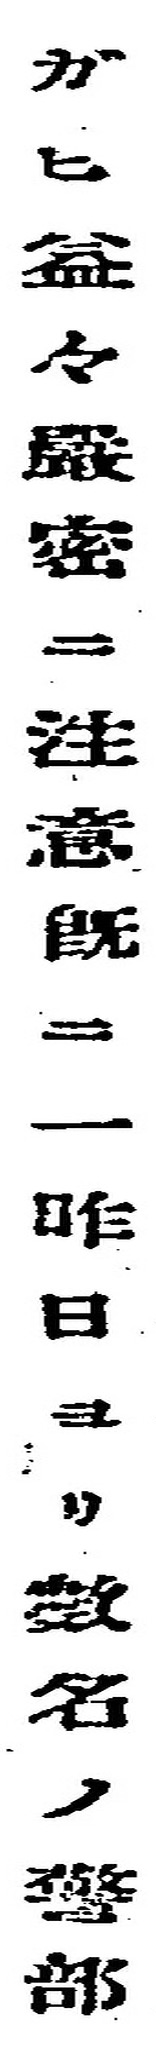ガヒ益々厳密ニ注意既ニ一昨日ヨリ数名ノ警部
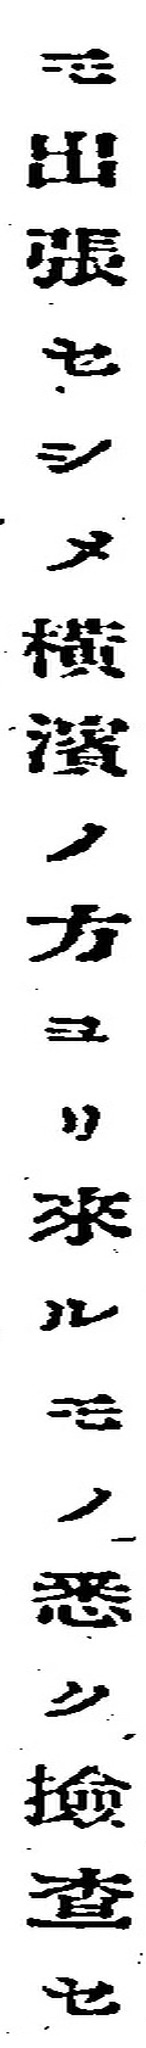モ出張セシメ横浜ノ方ヨリ来ルモノ悉ク撿査セ
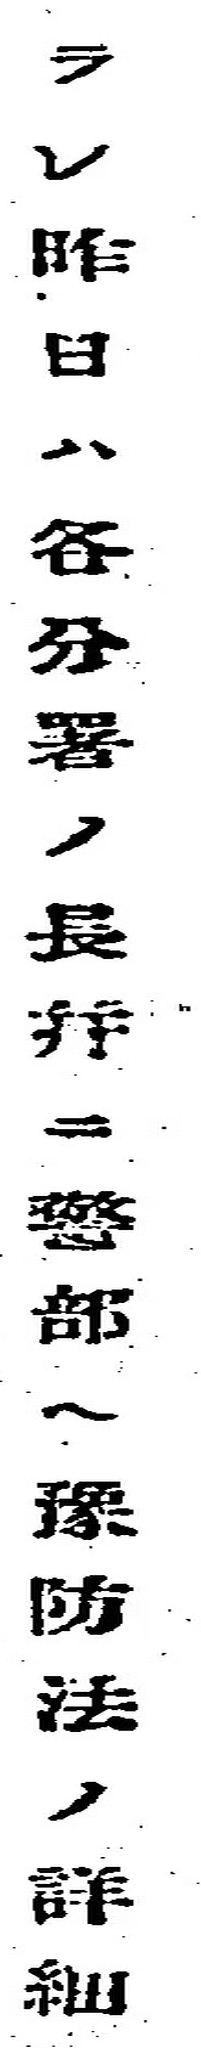ラレ昨日ハ各分署ノ長并ニ警部ヘ予防法ノ詳細
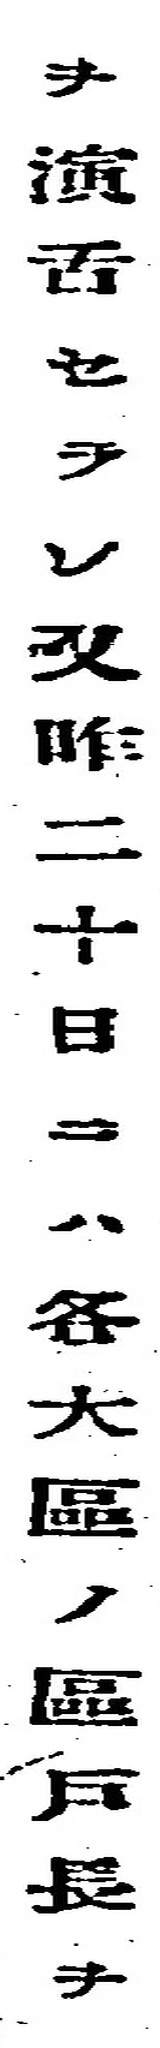ヲ演舌セラレ又昨二十日ニハ各大区ノ区戸長ヲ
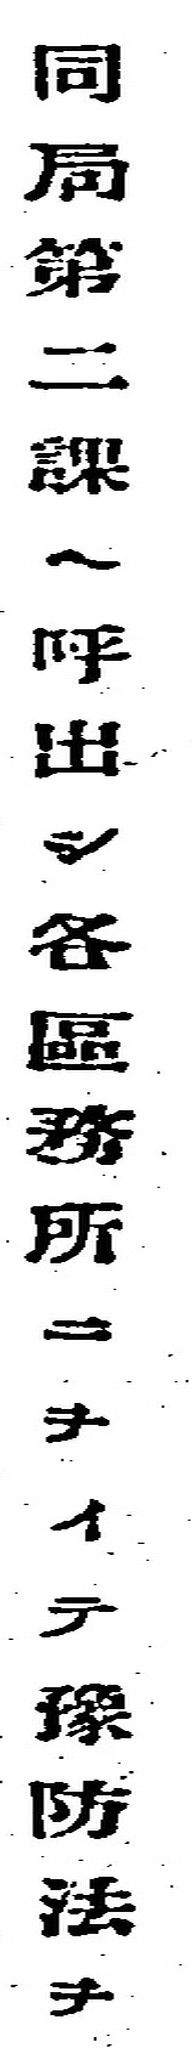同局第二課ヘ呼出シ各区務所ニヲイテ予防法ヲ
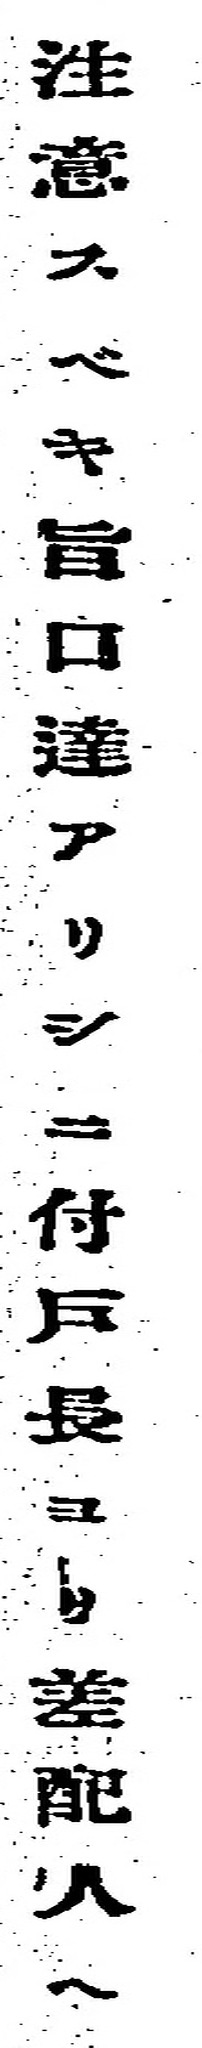注意スベキ旨口達アリシニ付戸長ヨリ差配人ヘ
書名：これら病予防心得
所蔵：国立国会図書館 National Diet Library, JAPAN
